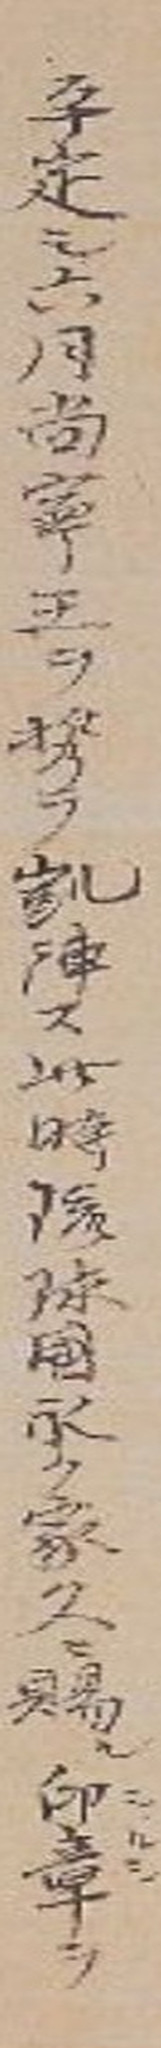平定シ六月尚寧王ヲ携テ凱陣ス此時琉国永ク家久ニ賜ル印章ヲ
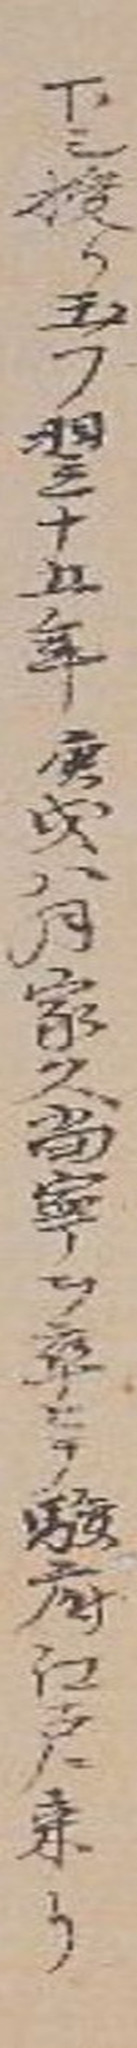下シ授リ玉フ翌十五年庚戌八月家久尚寧ヲ率ヒテ駿府江戸ニ来リ
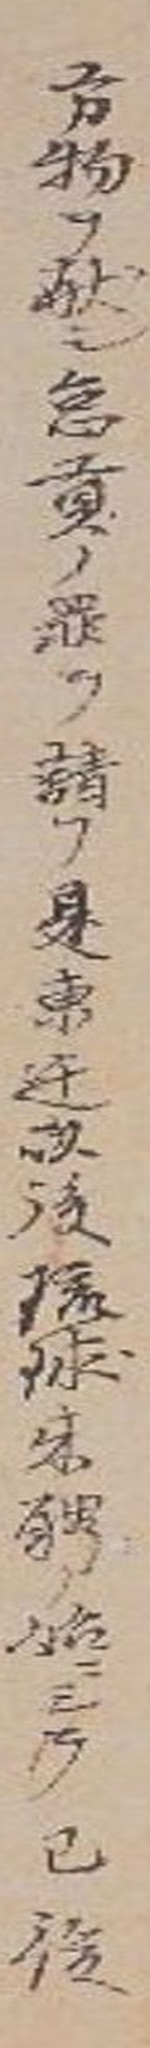方物ヲ献シ怠貢ノ罪ヲ請フ是東迁以後琉球来聘ノ始ニシテ已後
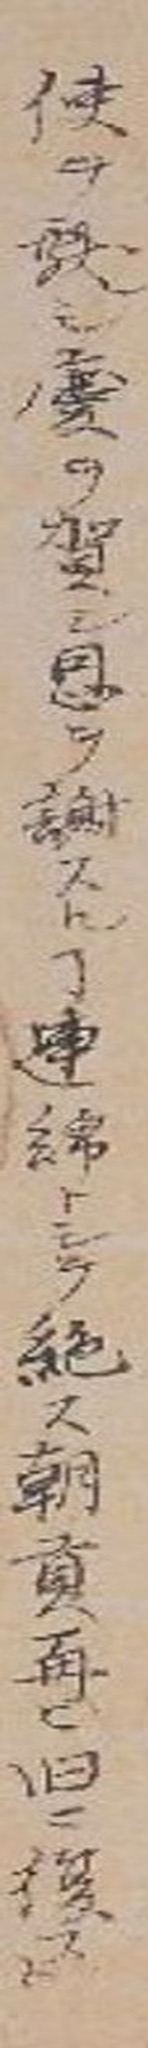使ヲ献シ慶ヲ賀シ恩ヲ謝スルコト連綿トシテ絶ス朝貢再ヒ旧ニ復スト

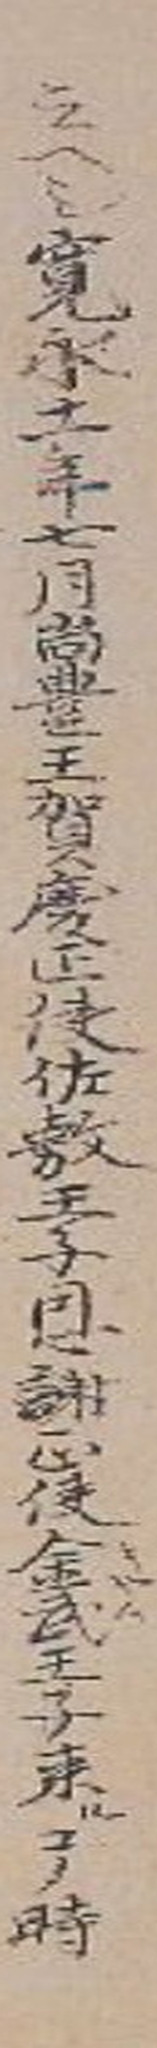云ヘシ寛永十一年七月尚豊王賀慶正使佐敷王子恩謝正使金武王子来ルコノ時
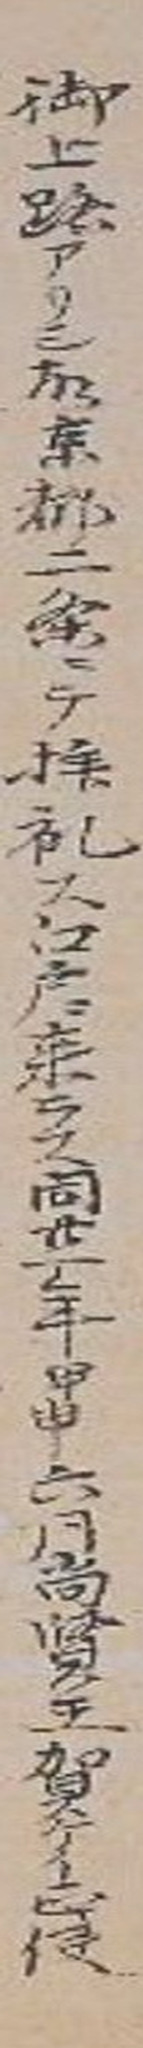御上路アリシ故京都二条ニテ拝礼ス江戸ニ来ラス同廿一年甲申六月尚賢王賀ケイ正使
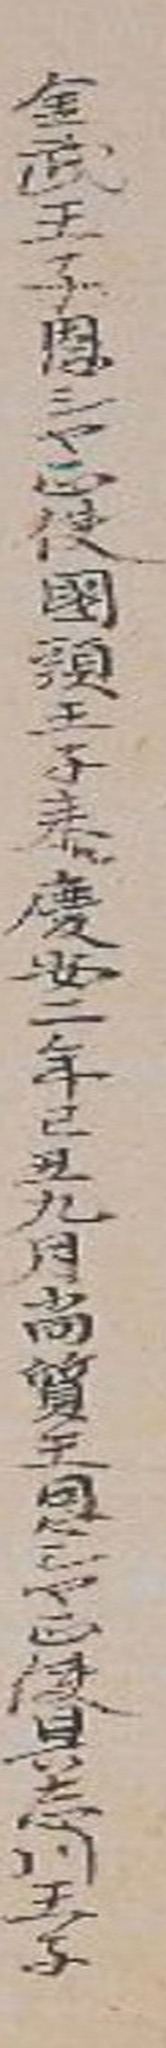金武王子恩シヤ正使国頭王子来ル慶安二年己丑九月尚質王恩シヤ正使具志川王子
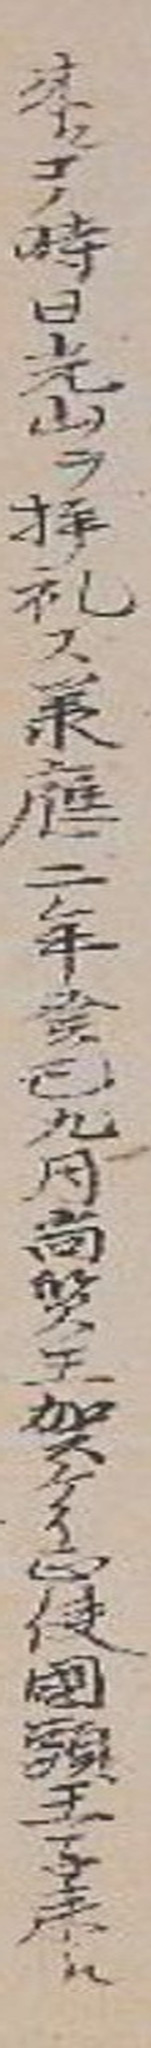来ルコノ時日光山ヲ拝礼ス承応二年癸巳九月尚質王賀ケイ正使国頭王子来ル
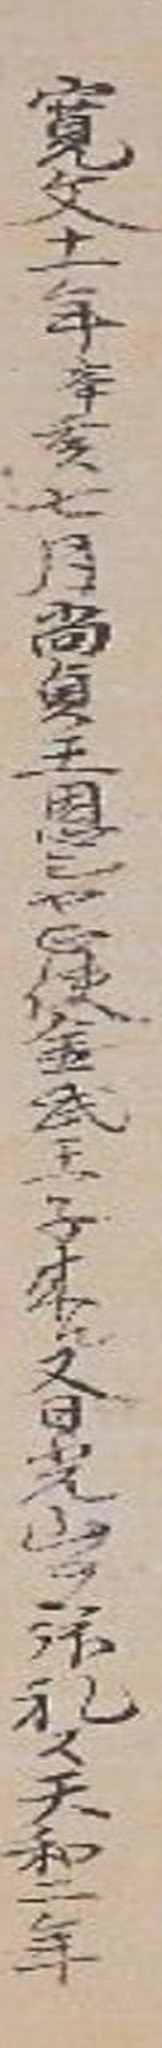寛文十一年辛亥七月尚貞王恩シヤ正使金武王子来ル又日光山ヲ拝礼ス天和二年
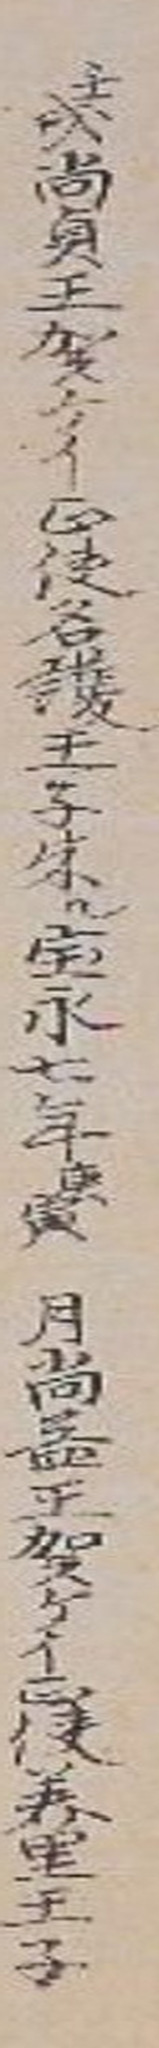壬戌尚貞王賀ケイ正使名護王子来ル宝永七年庚寅月尚益王賀ケイ正使美里王子
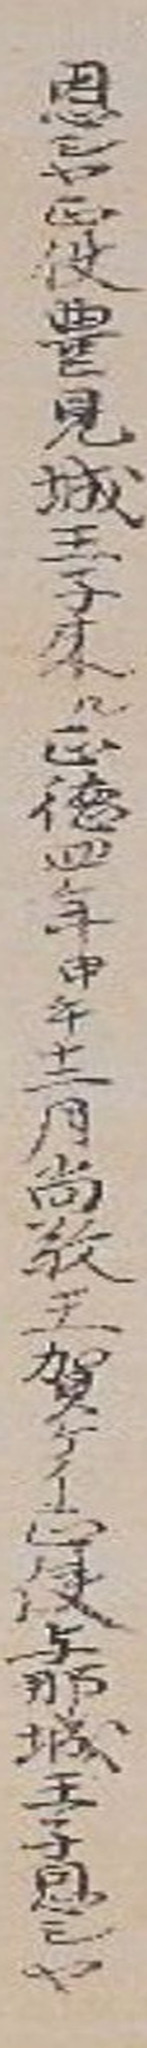恩シヤ正使豊見城王子来ル正徳四年甲午十二月尚敬王賀ケイ正使与那城王子恩シヤ
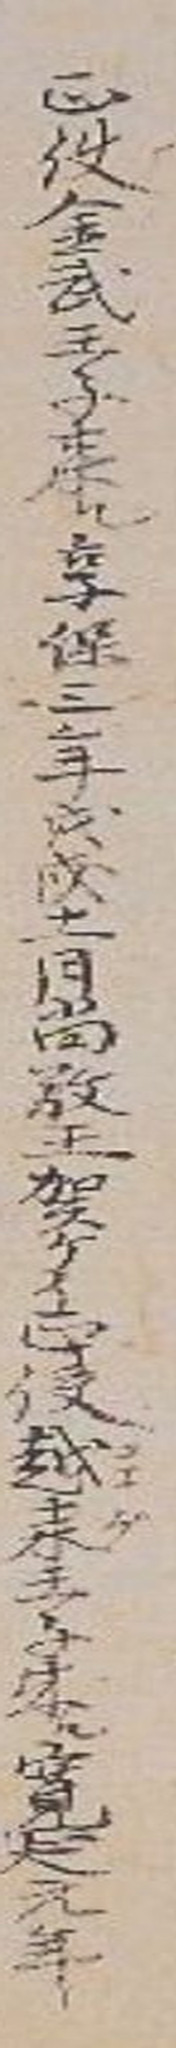正使金武王子来ル享保三年戊戌十一月尚敬王賀ケイ正使越来王子来ル寛延元年
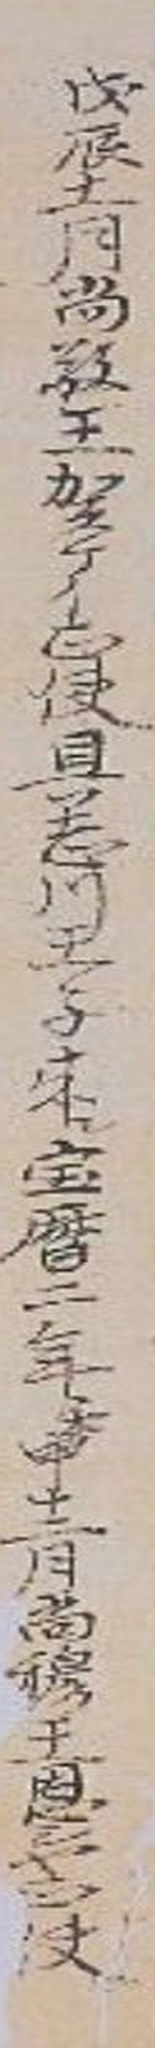戊辰十一月尚敬王賀ケイ正使具志川王子来ル宝暦二年壬申十二月尚穆王恩シヤ正使
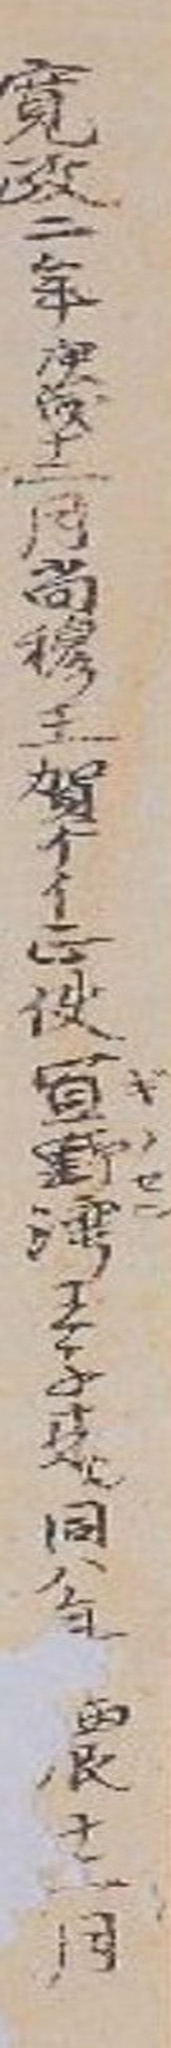寛政二年庚戌十二月尚穆王賀ケイ正使宜野湾王子来ル同八年丙辰十二月
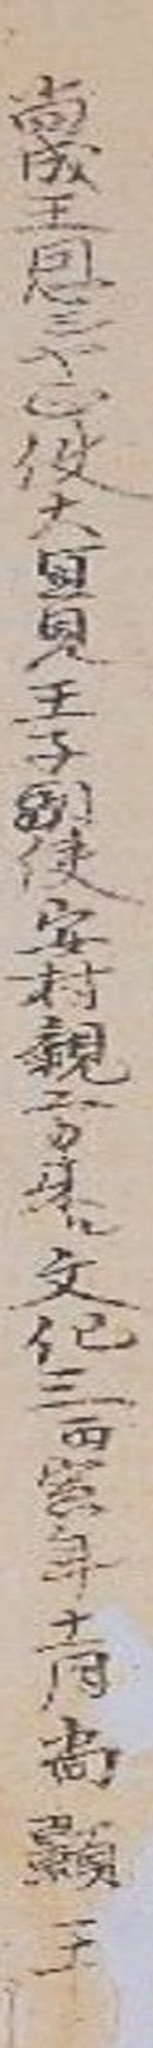尚成王恩シヤ正使大宜見王子副使安村親方来ル文化三年丙寅年十一月尚顥王
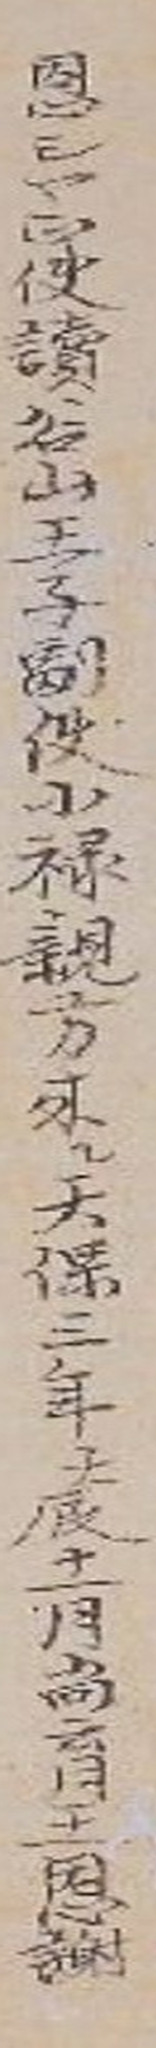恩シヤ正使読谷山王子副使小禄親方来ル天保三年壬辰十一月尚育王恩謝
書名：琉球来聘志(仮) 天保十三年
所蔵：University of the Ryukyus Library
